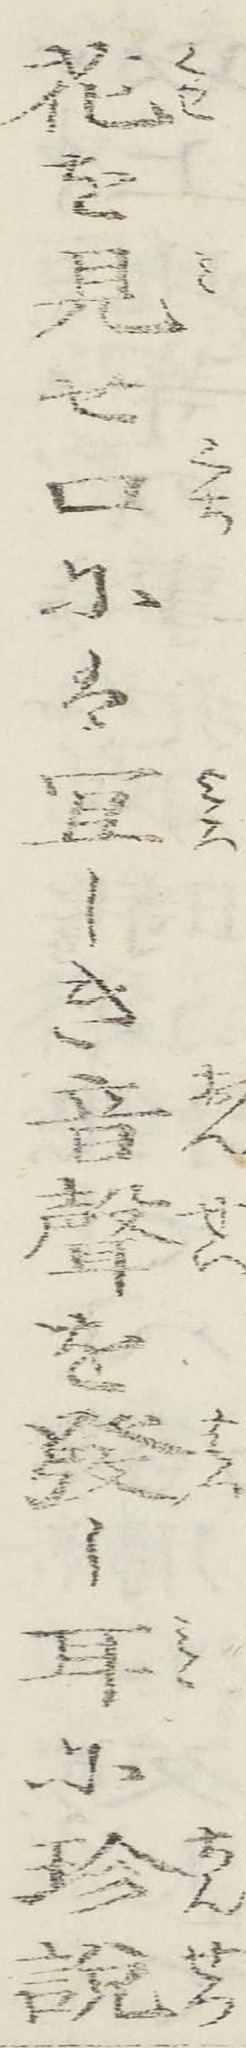花を見せ口には宜しき音声を発し耳に珍説
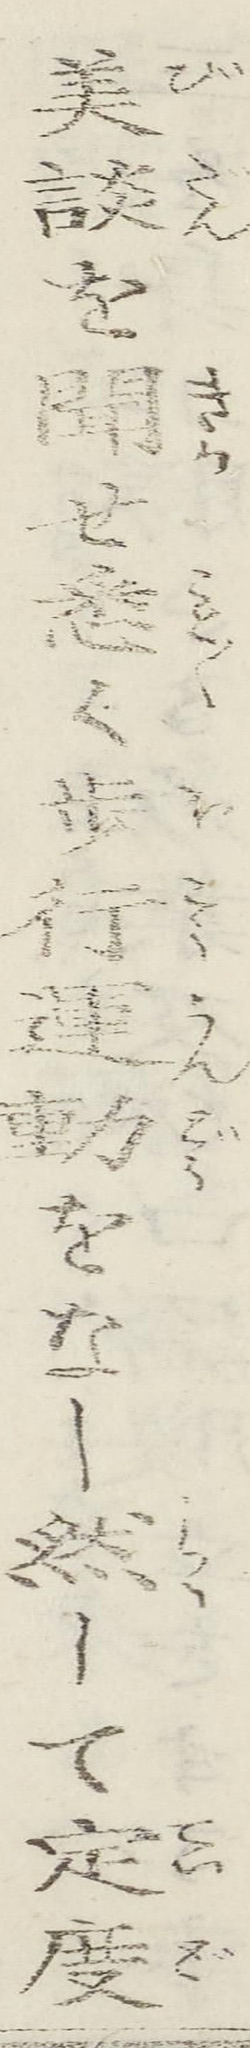美談を聞せ悉く歩行運動をなし然して定度
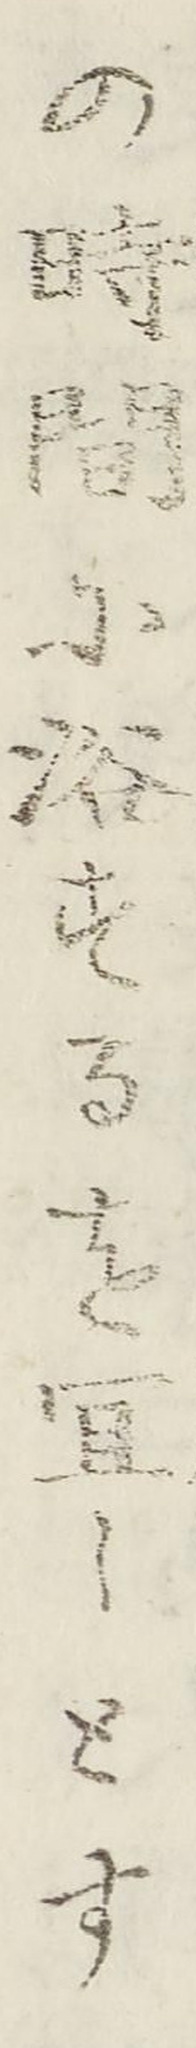の時間に浴するを宜しとす

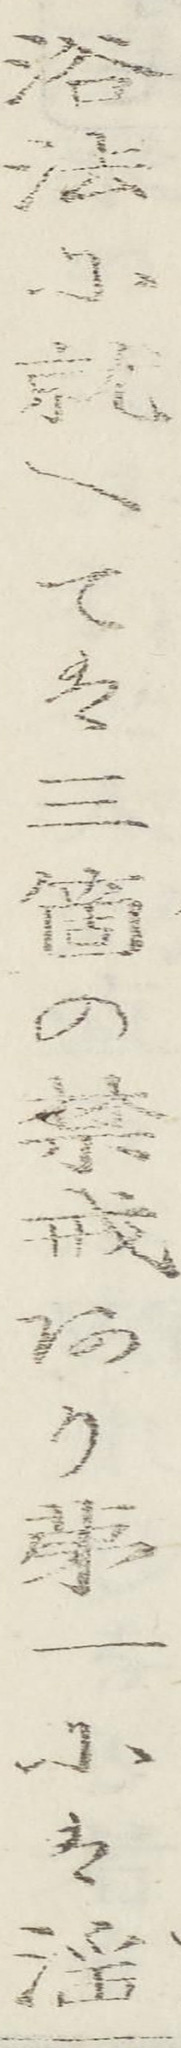浴法に就いては三箇の禁戒あり第一には淫
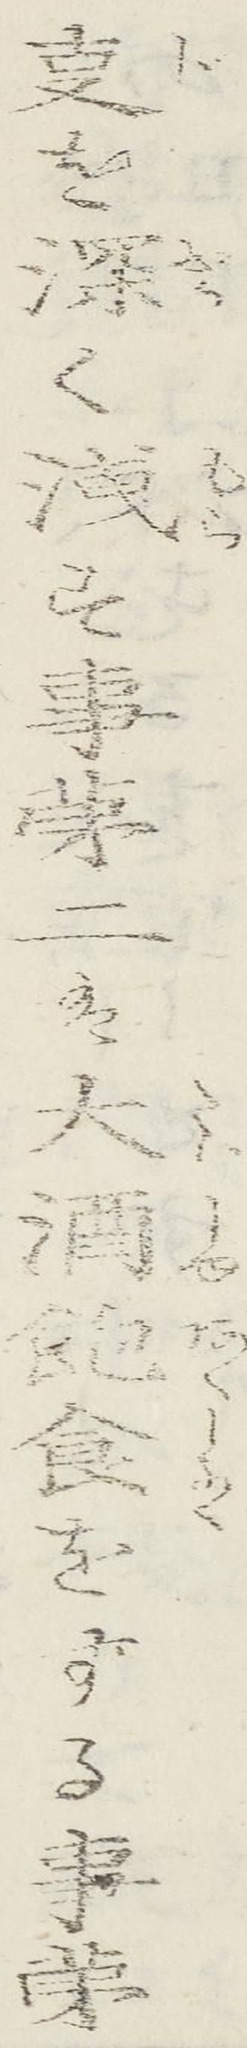事を深く洩す事第二は大酒飽食をする事第
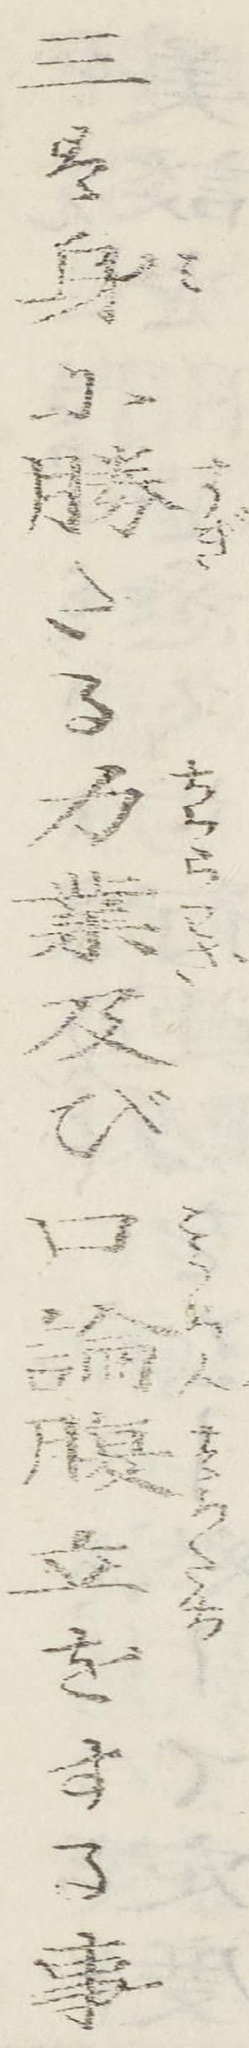三は身に勝たる力業及び口論腹立をする事
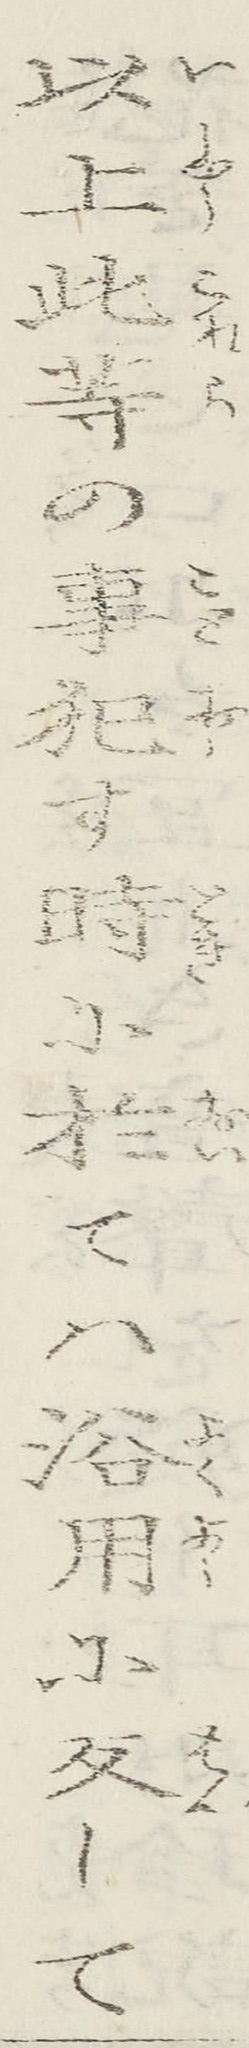以上此等の事犯す時に於ては浴用に反して
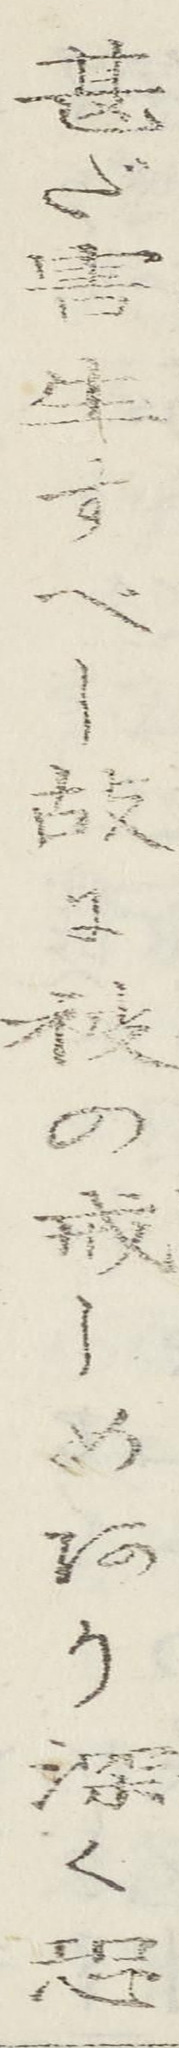甚だ害生すべし故に被の戒しめあり深く恐
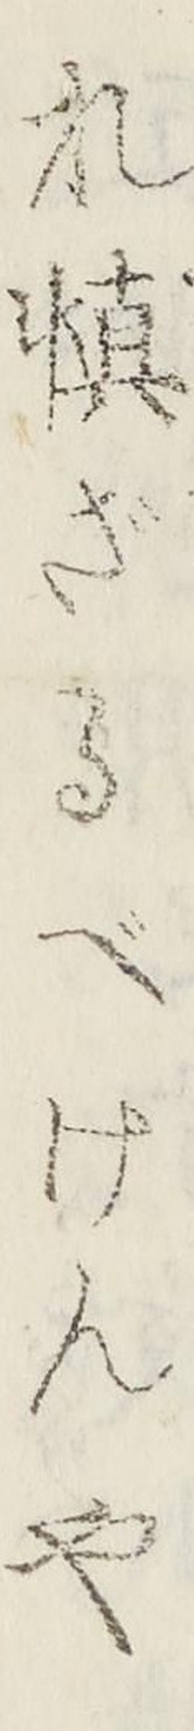れ慎ざるべけんや
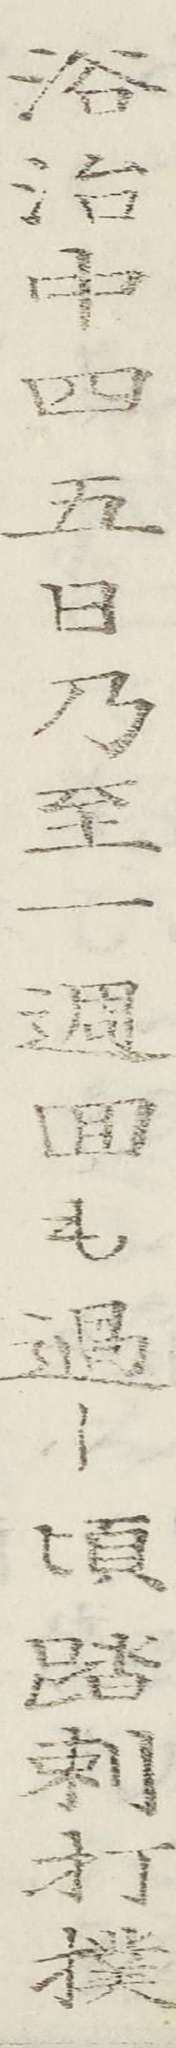浴治中四五日乃至一週回も過し頃踏刺打撲
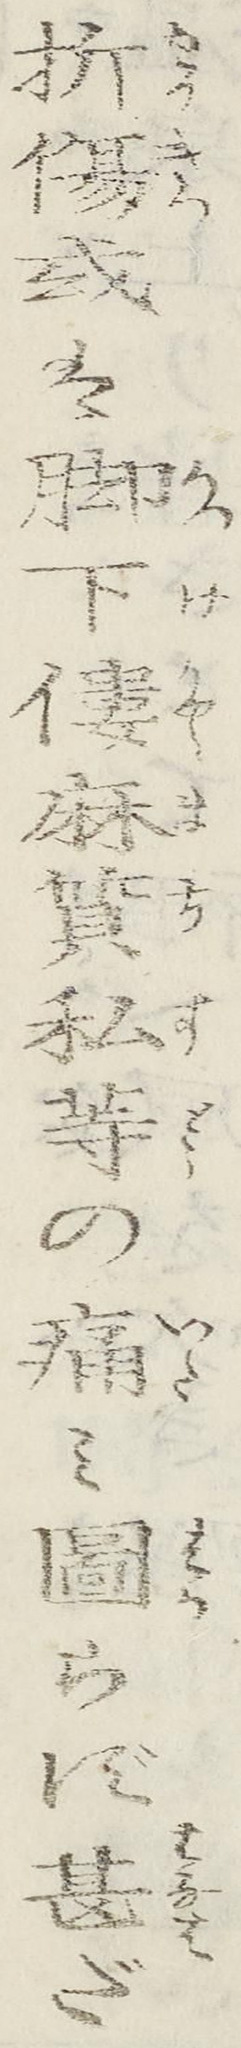折傷或は脚下僂麻質私等の痛み図らず甚だ
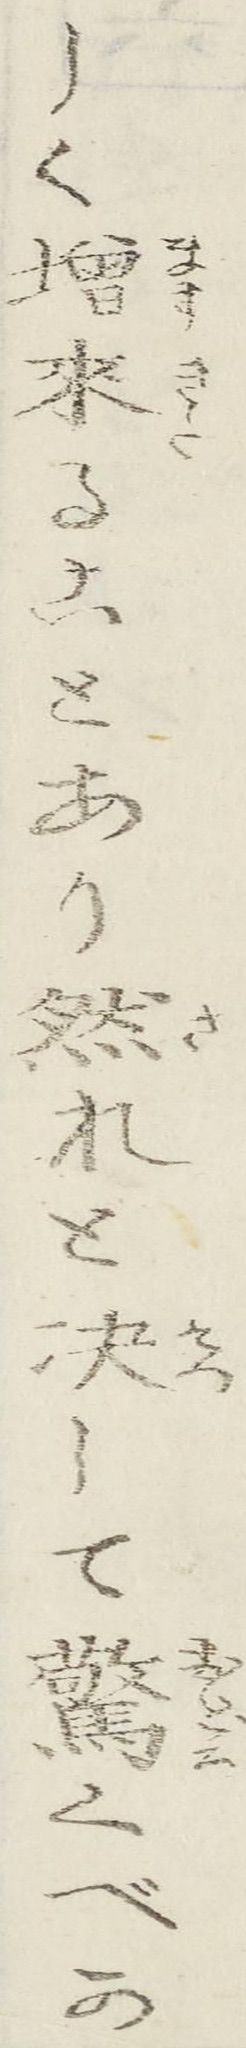しく増来ることあり然れと決して驚くべか
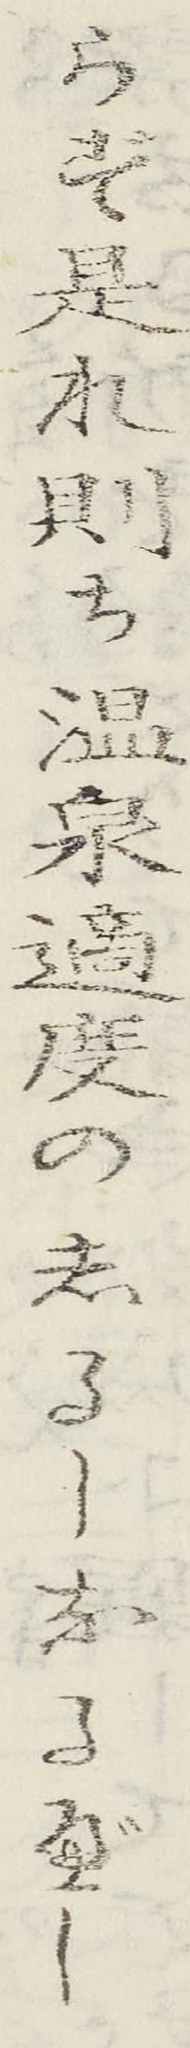らず是れ則ち温泉適度のしるしなるべし
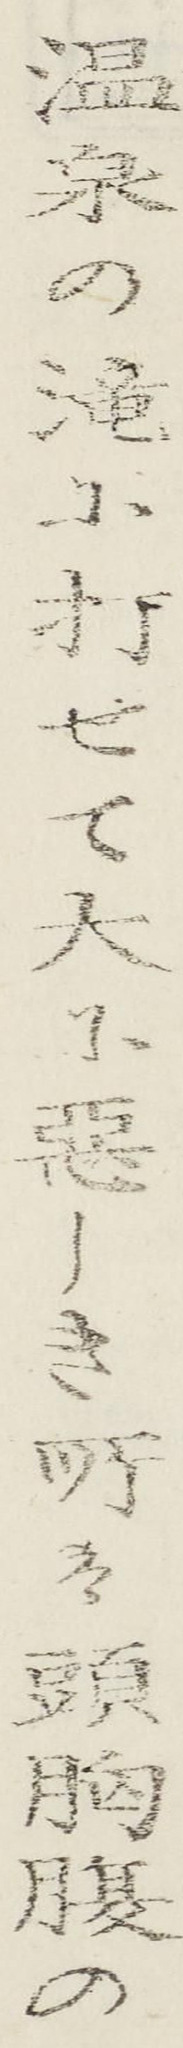温泉の滝に打せて大に悪しき所は頭胸腹の
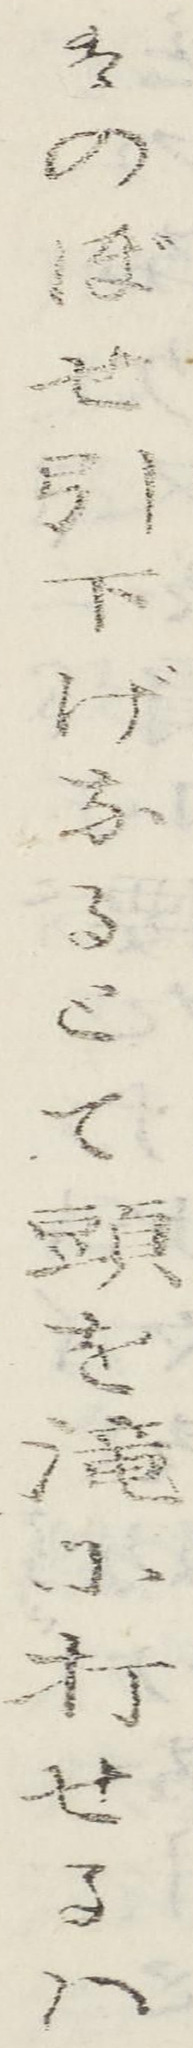はのぼせ引下げなるとて頭を滝に打せるは
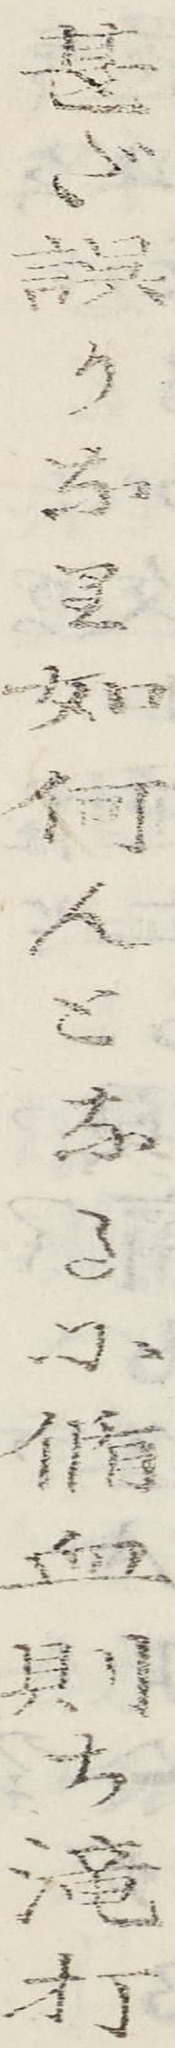甚だ誤りなり如何んとなるに循血則ち滝打
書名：鎌先温泉由來記
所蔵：東京大学地震研究所図書室 Earthquake Research Institute Library, The University of Tokyo, JAPAN
